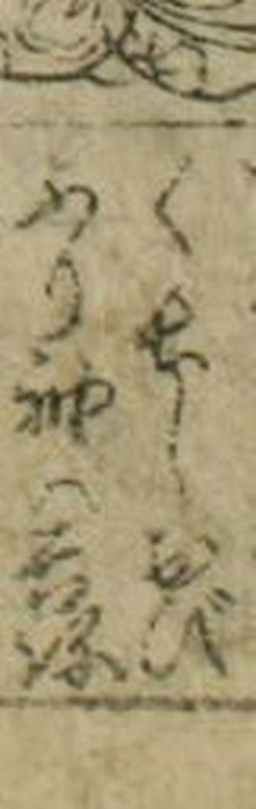ふり袖は吉弥
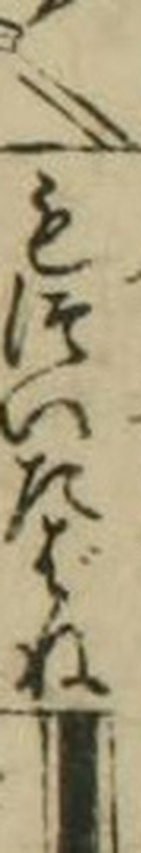をついたばね
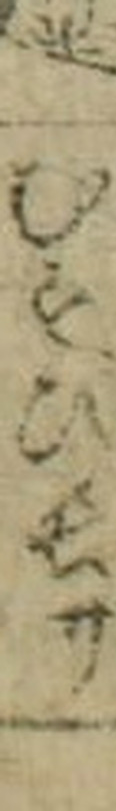むすび長さ
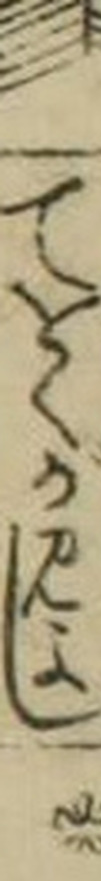てをくが見よし
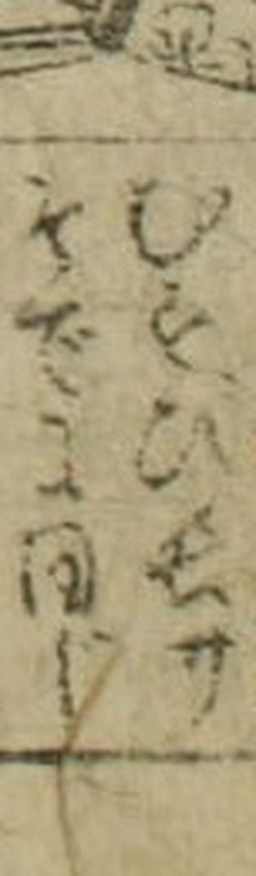そでに同じ
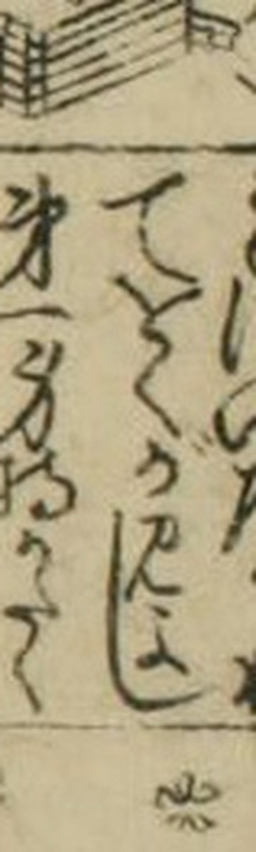第一身持かたく
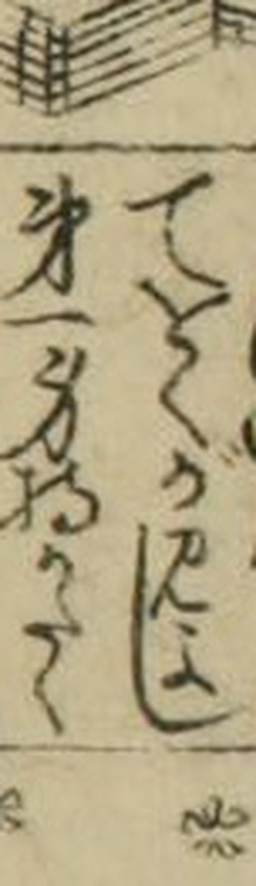第一身持かたく
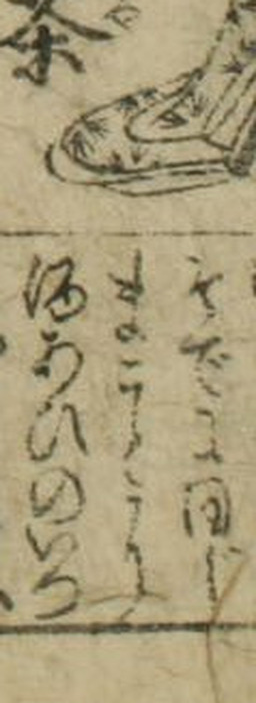まことに
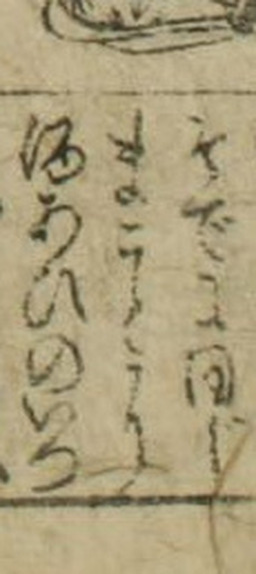まことに
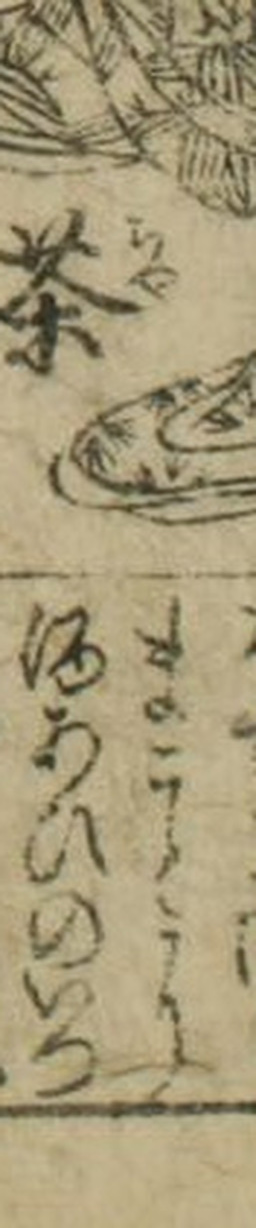酒あひのいつ
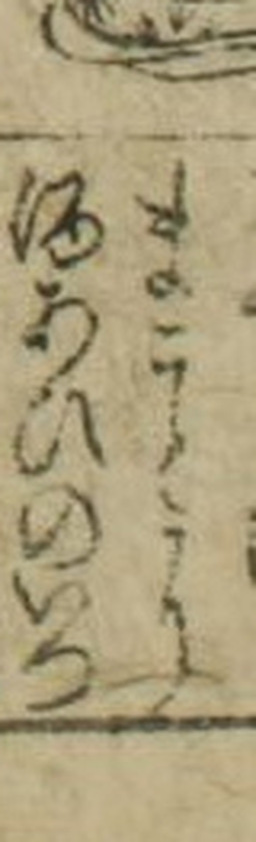酒あひのいつ
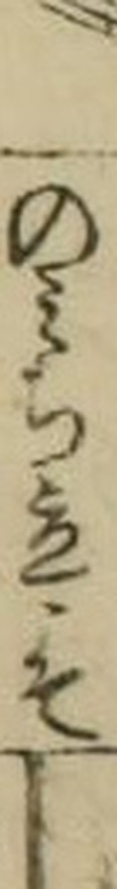みち立こそ
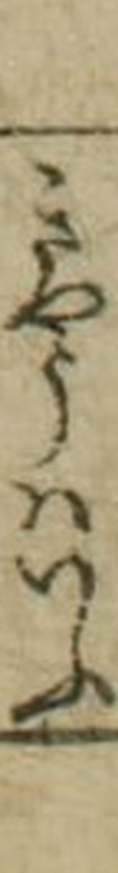きやうはいふ
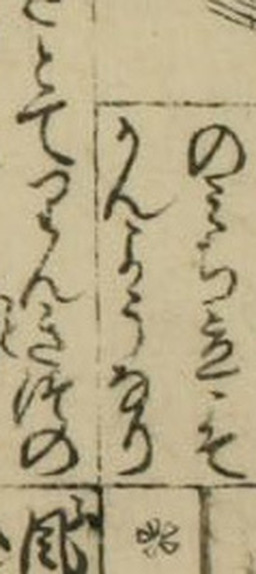かんようなり
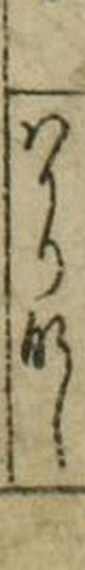はかりなし
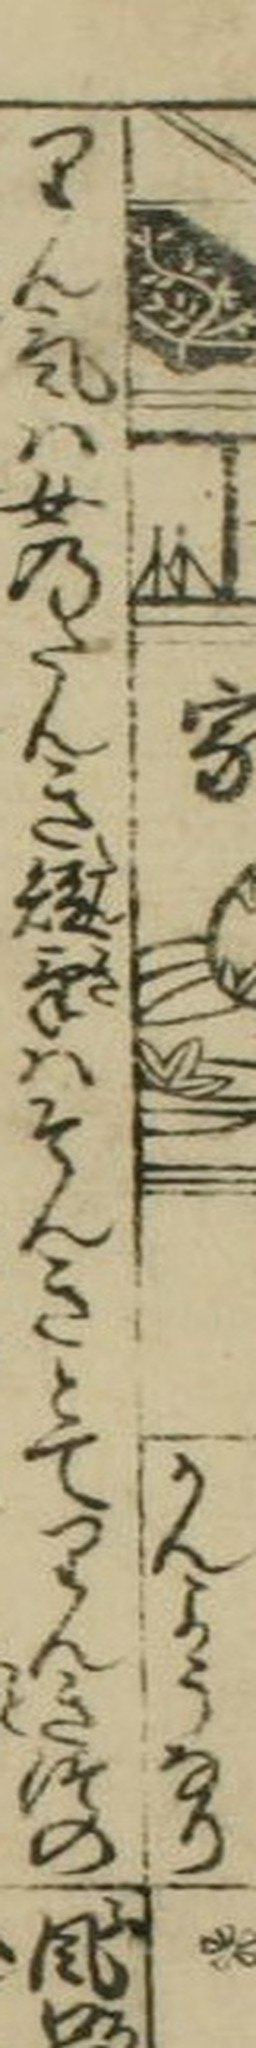りん気は女のたんき短気はそんきとてりんきつの
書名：女源氏教訓鑑
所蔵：東京学芸大学附属図書館
